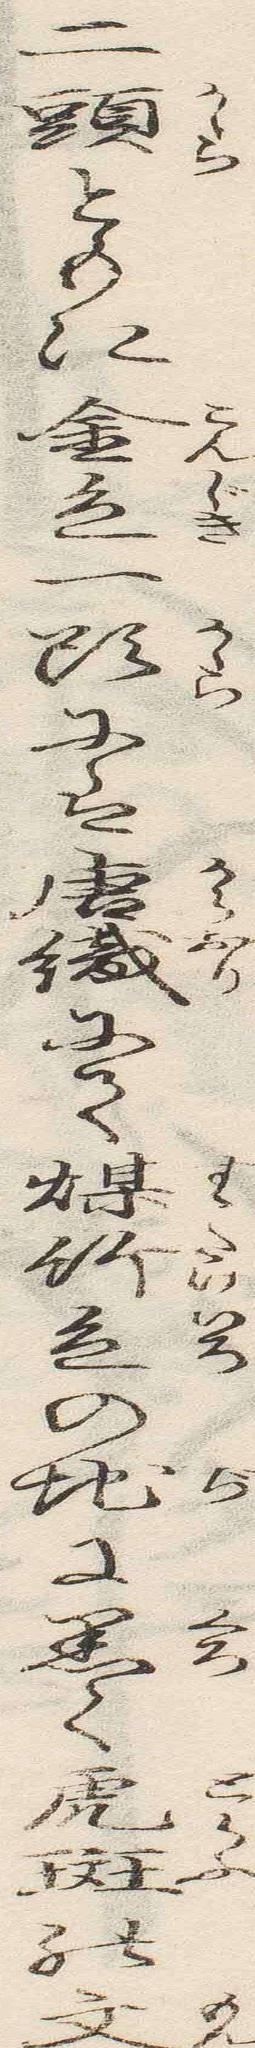二頭ともに金色一頭には唐織にて煤竹色の地に黒く虎斑の文
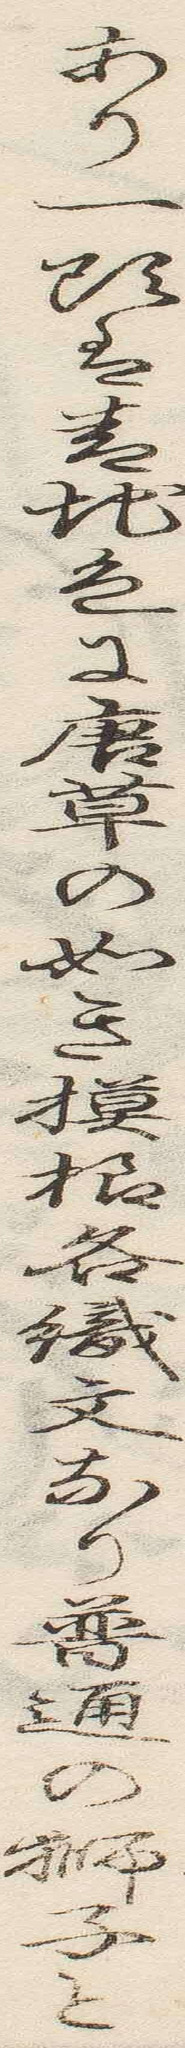あり一頭は青地色に唐草の如き摸様各織文なり普通の獅子と
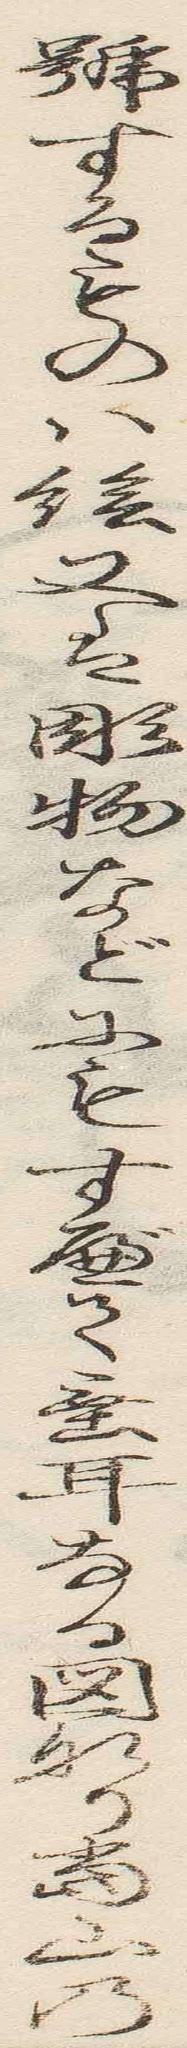號するものは繪又は彫物などにもすべて垂耳なる図なり當山の
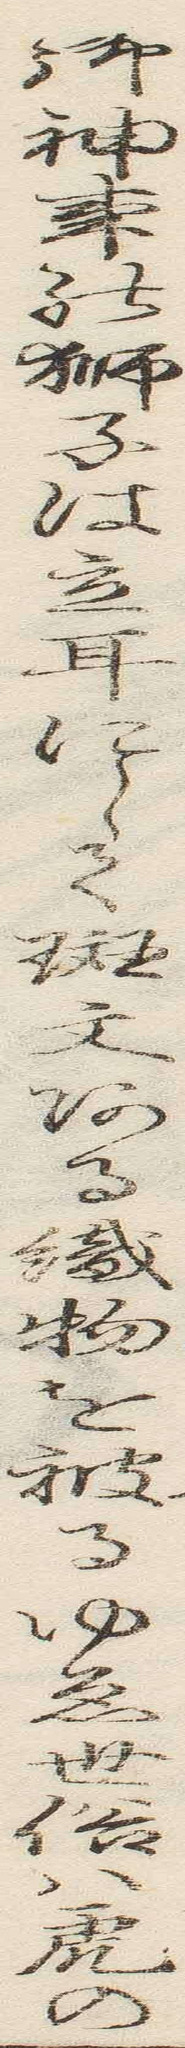御神事の獅子は立耳にして斑文ある織物を被るゆゑ世俗は虎の
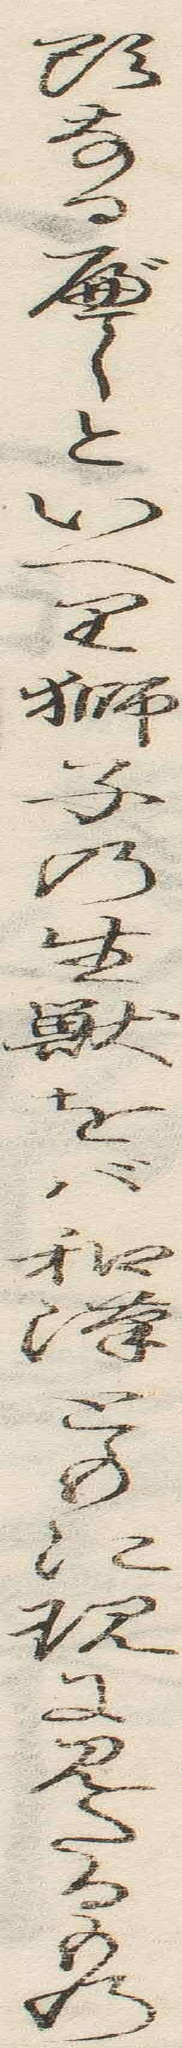頭なるべしといへり獅子の生獣をば和漢ともに現に見たるもの
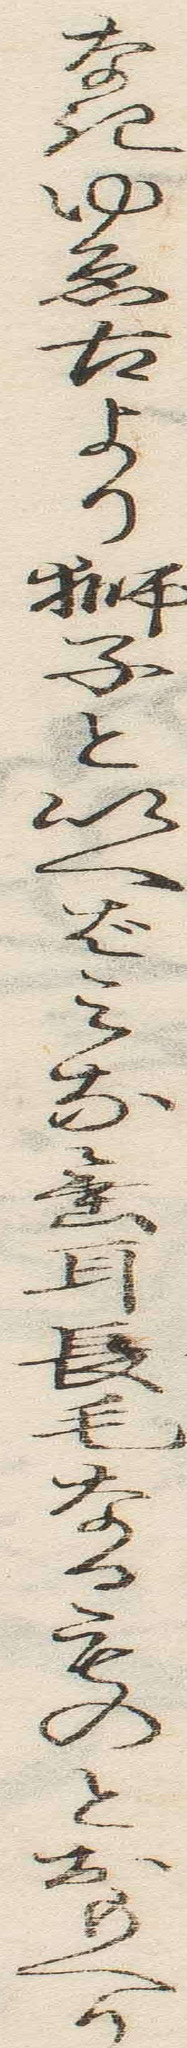なきゆゑ古より獅子といへばみな垂耳長毛なるものとおもへり
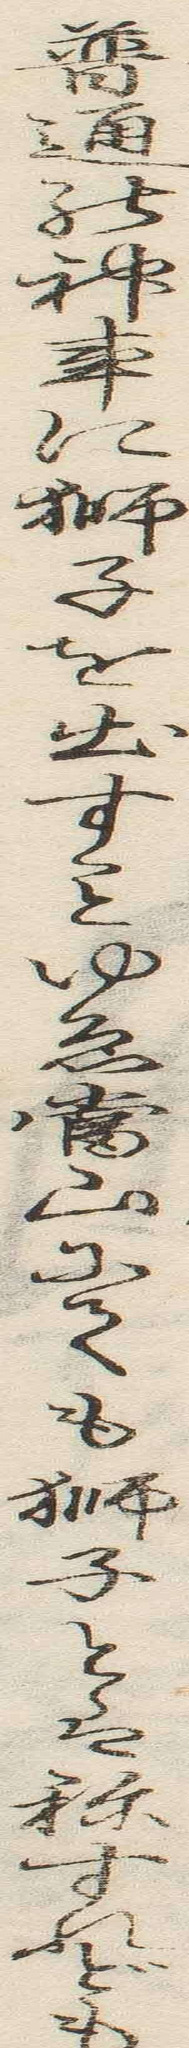普通の神事に獅子を出すことゆゑ當山にても獅子とは称すれども
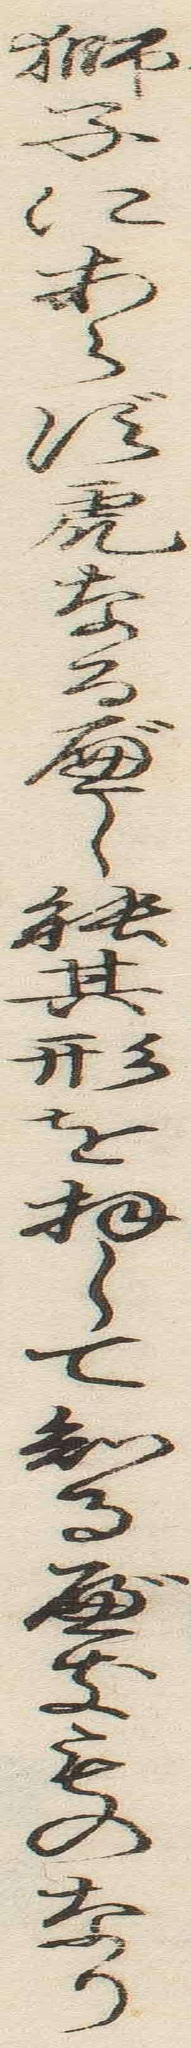獅子にあらず虎なるべし能其形を拝して知るべきものなり
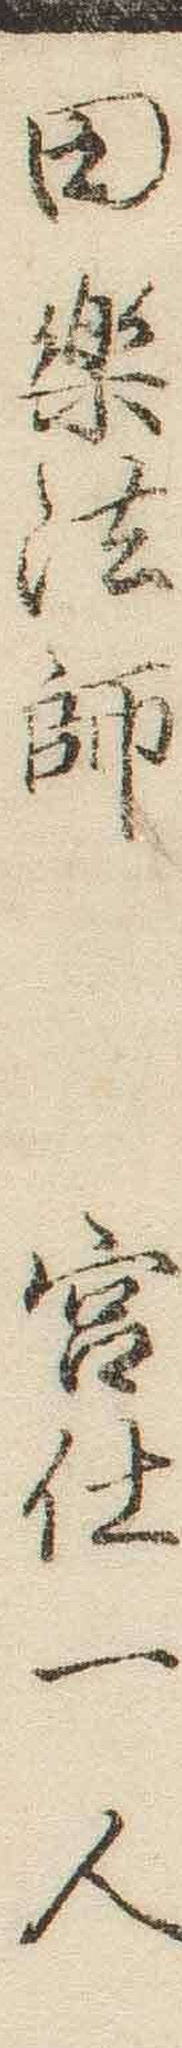田樂法師宮仕一人

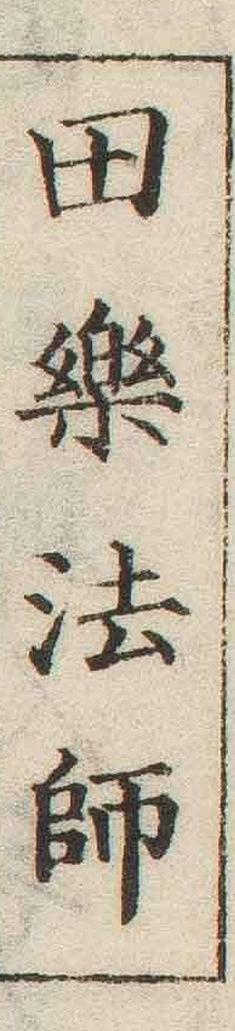田樂法師

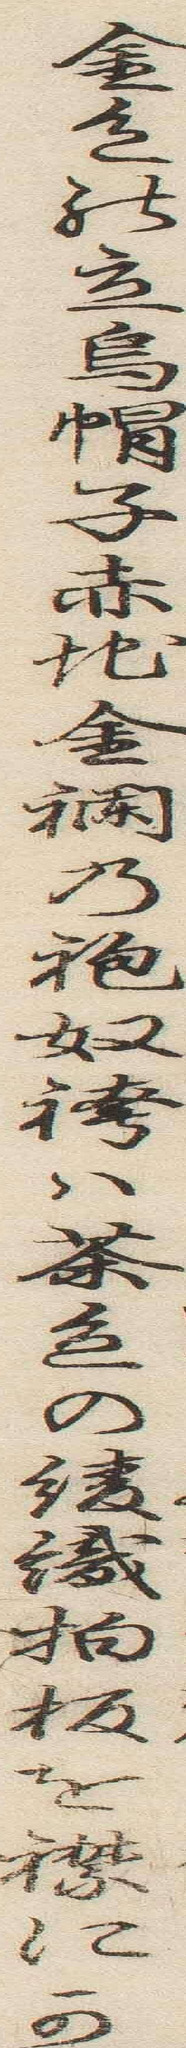金色の立烏帽子赤地金襴の袍奴袴は茶色の綾織拍板を襟にか
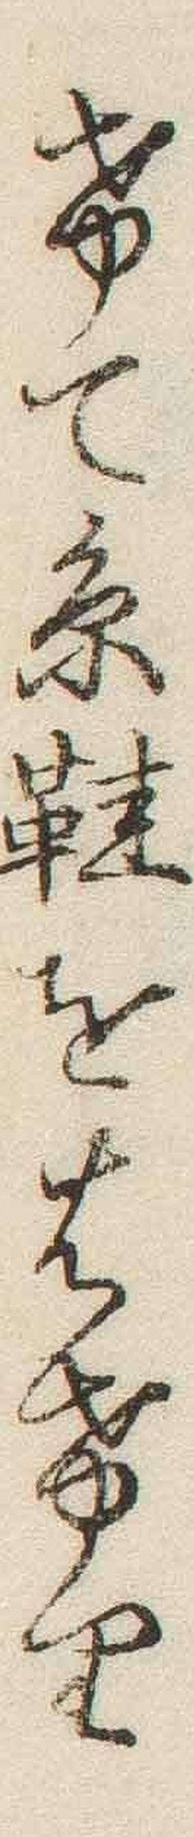けて糸鞋をはけり
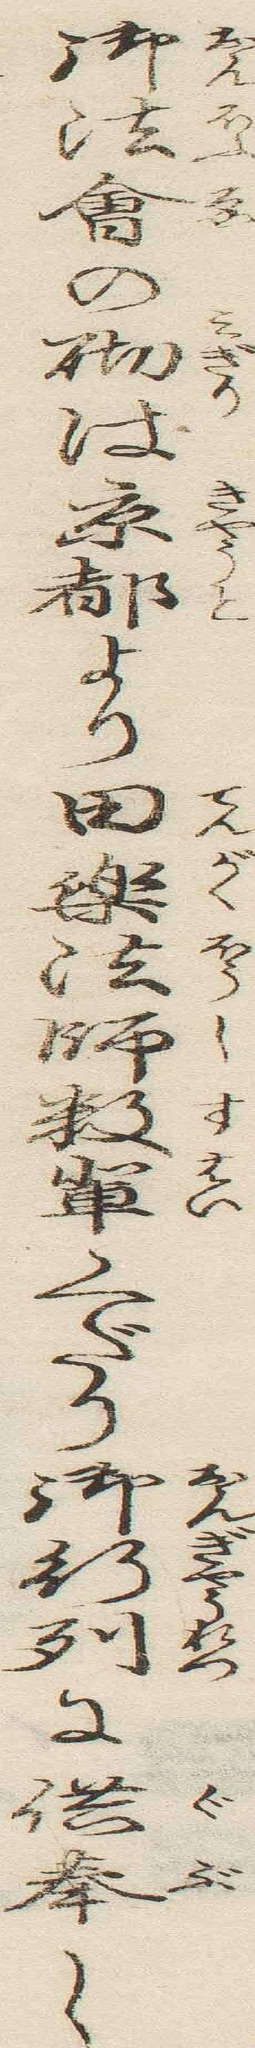御法會の砌は京都より田樂法師数軰くだり御行列に供奉し
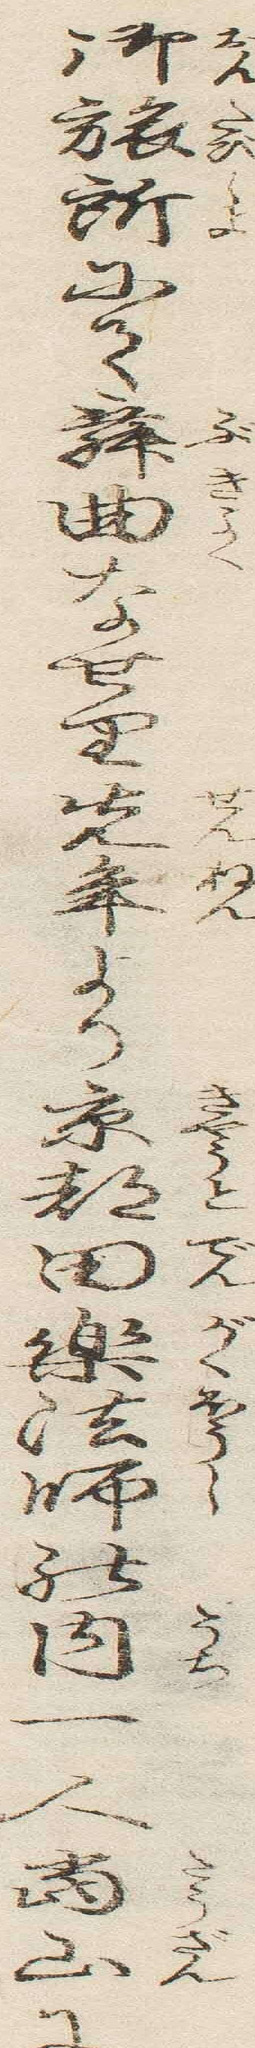御旅所にて舞曲なせり先年より京都田樂法師の内一人當山に
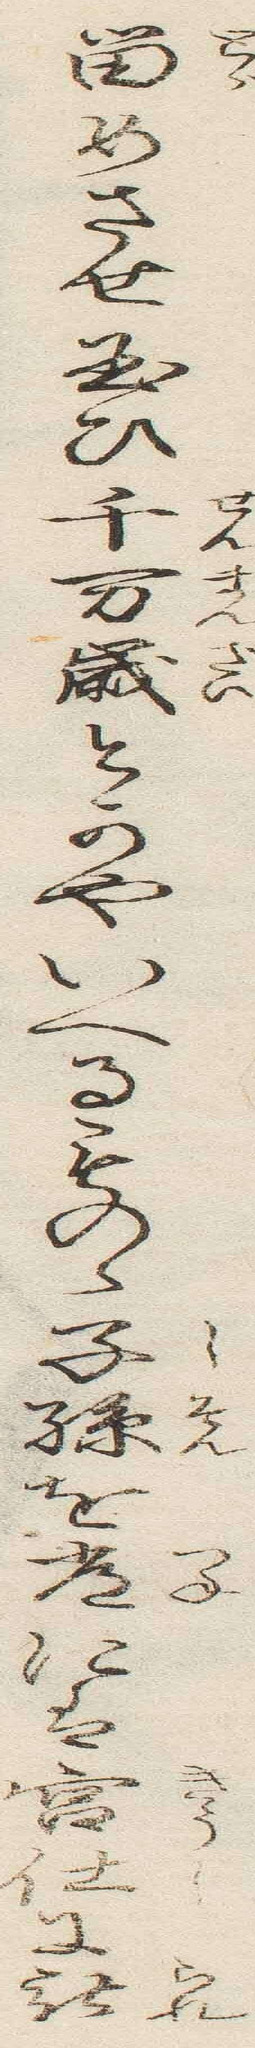畄めさせ玉ひ千万歳とかやいへるものゝ子孫を常には宮仕に被
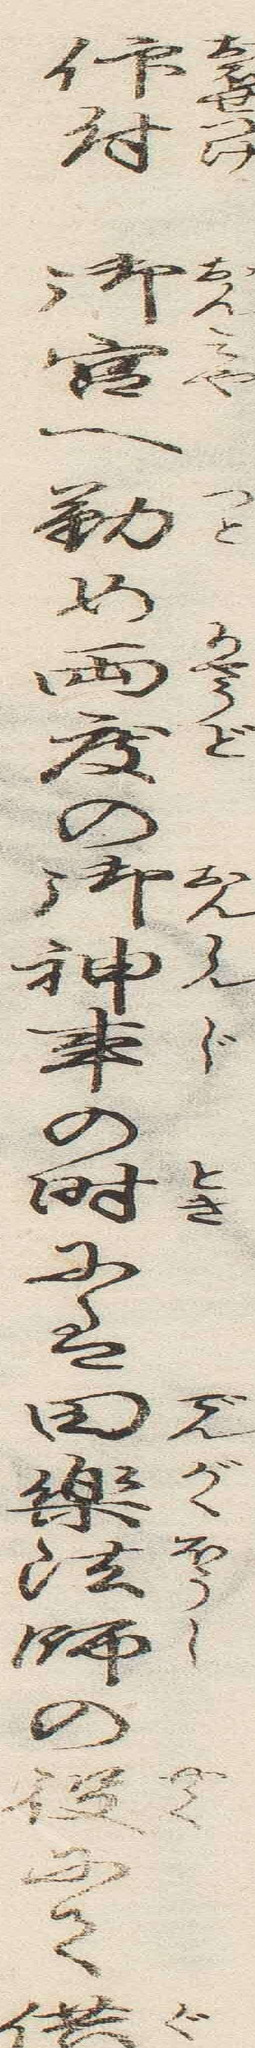仰付御宮へ勤め両度の御神事の时には田樂法師の役にて供
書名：日光山志
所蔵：東京学芸大学附属図書館 国文学研究資料館
